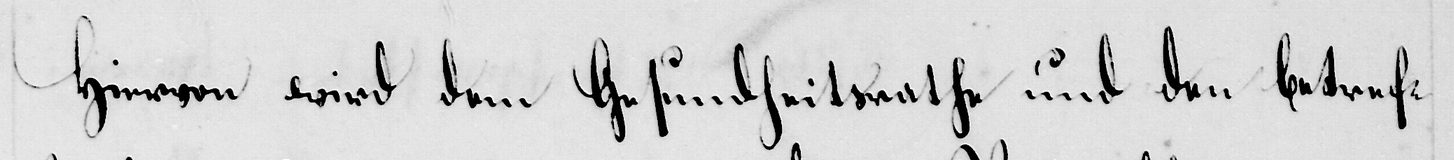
Hiervon wird dem Gesundheitsrathe und den betref¬
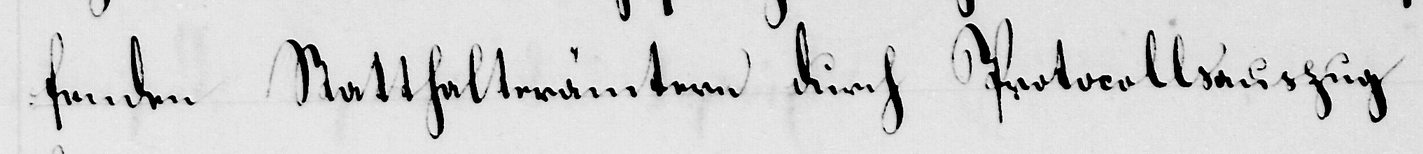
fenden Statthalterämtern durch Protocollsauszug
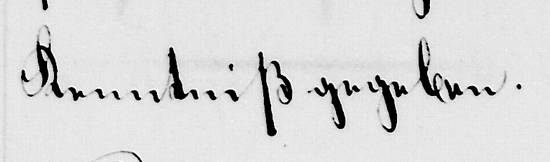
Kenntniß gegeben.
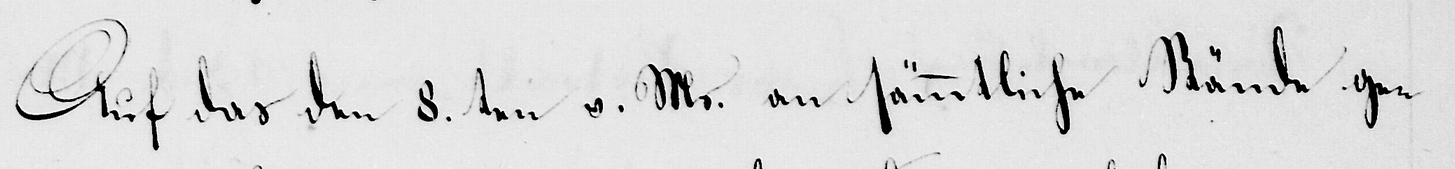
Auf das den 8.ten v. Ms. an sämmtliche Stände ge¬
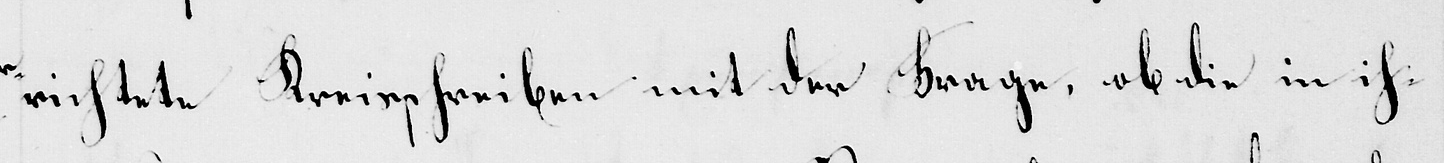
richtete Kreisschreiben mit der Frage, ob die in ih¬
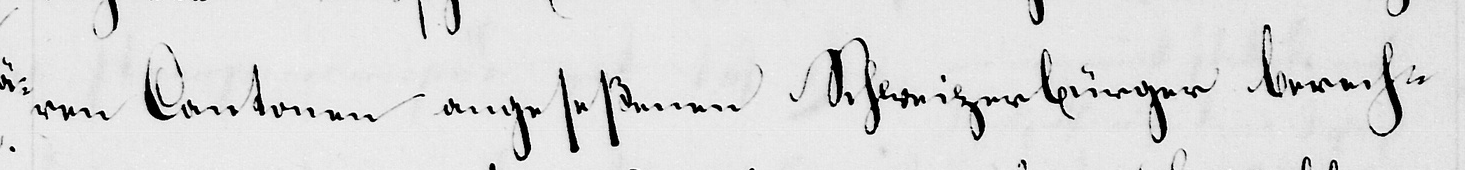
ren Cantonen angeseßenen Schweizerbürger berech¬
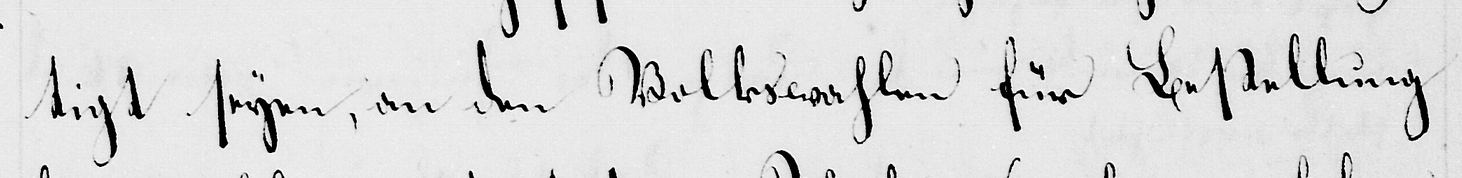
tigt seyen, an den Volkswahlen für Bestellung
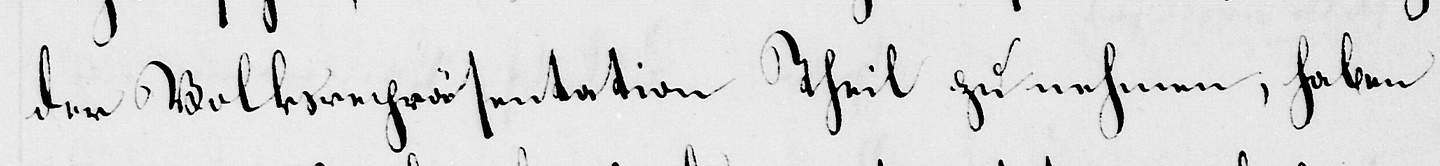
der Volksrepräsentation Theil zu nehmen, haben
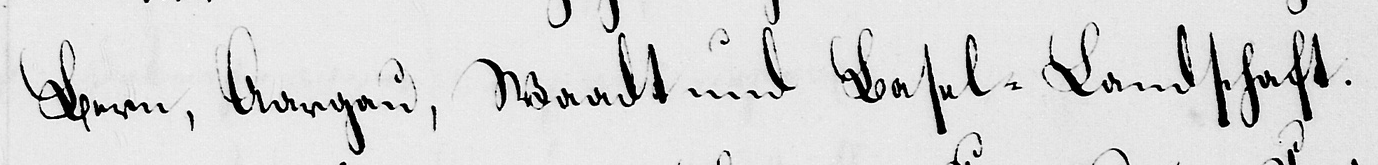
Bern, Aargau, Waadt und Basel-Landschaft.
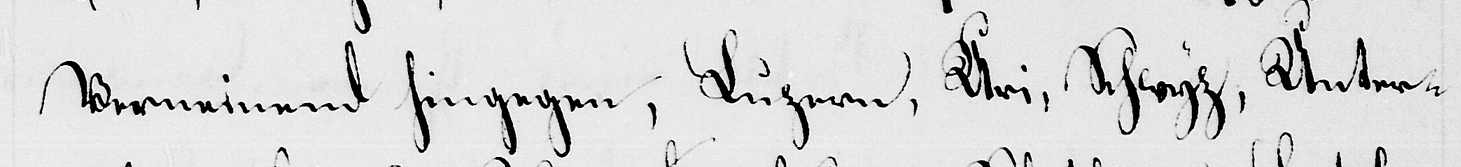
Verneinend hingegen, Luzern, Uri, Schwyz, Unter¬
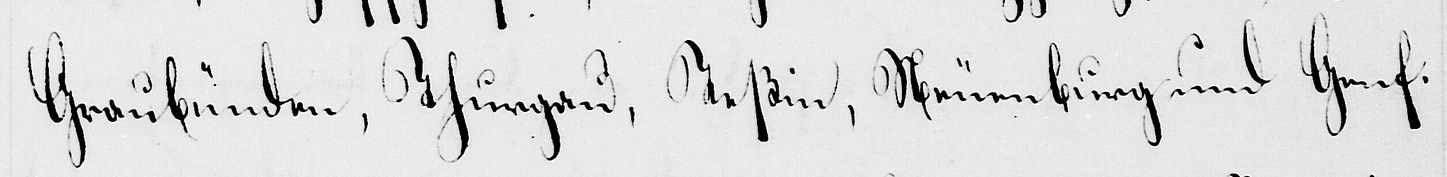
Graubünden, Thurgau, Teßin, Neuenburg und Genf.
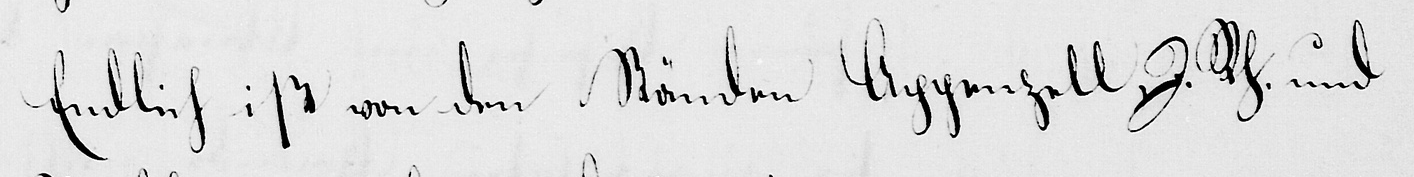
Endlich ist von den Ständen Appenzell I. Rh. und
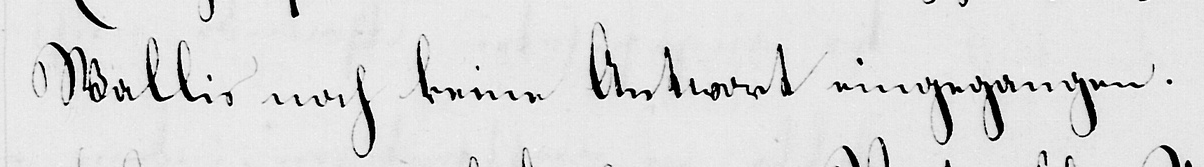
Wallis noch keine Antwort eingegangen.
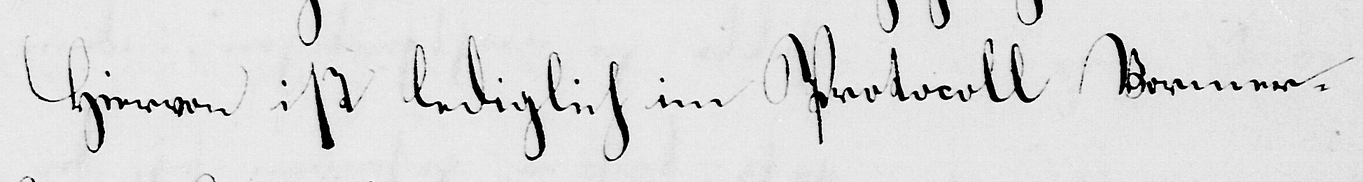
Hiervon ist lediglich im Protocoll Vormer¬
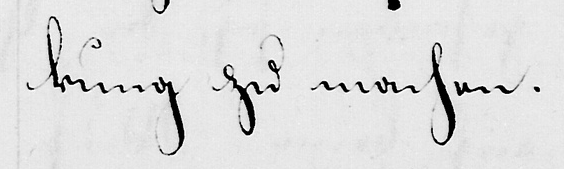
kung zu machen.
